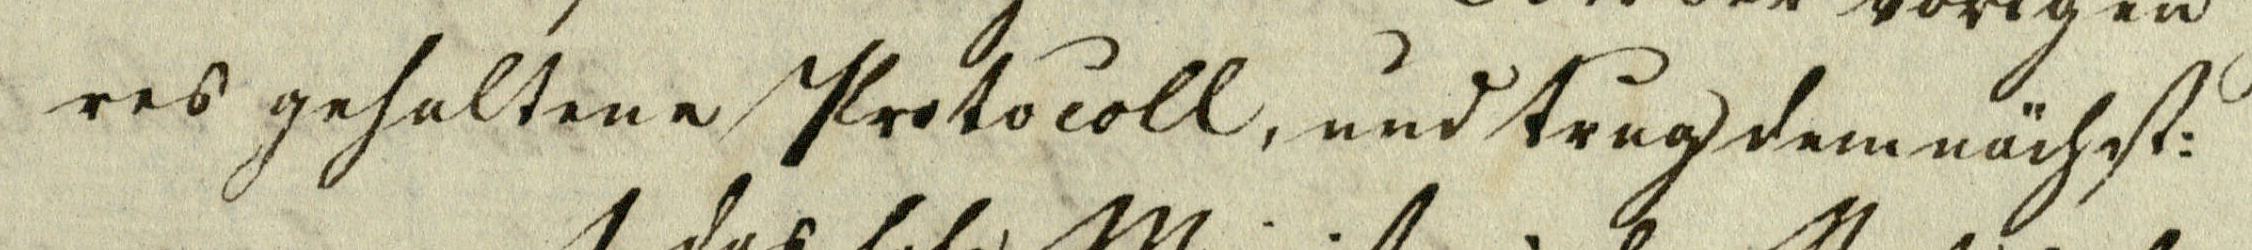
res gehaltene Protocoll, und trug demnächst:
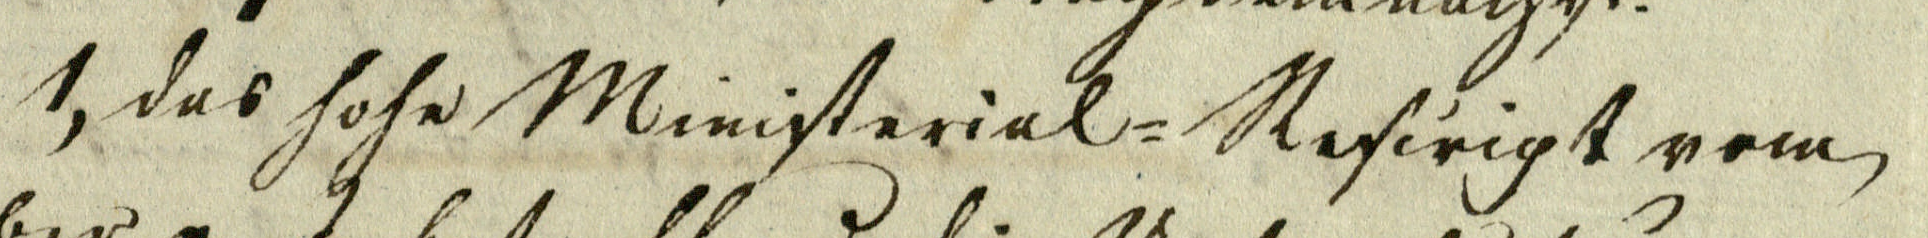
1, das hohe Ministerial-Rescript vom
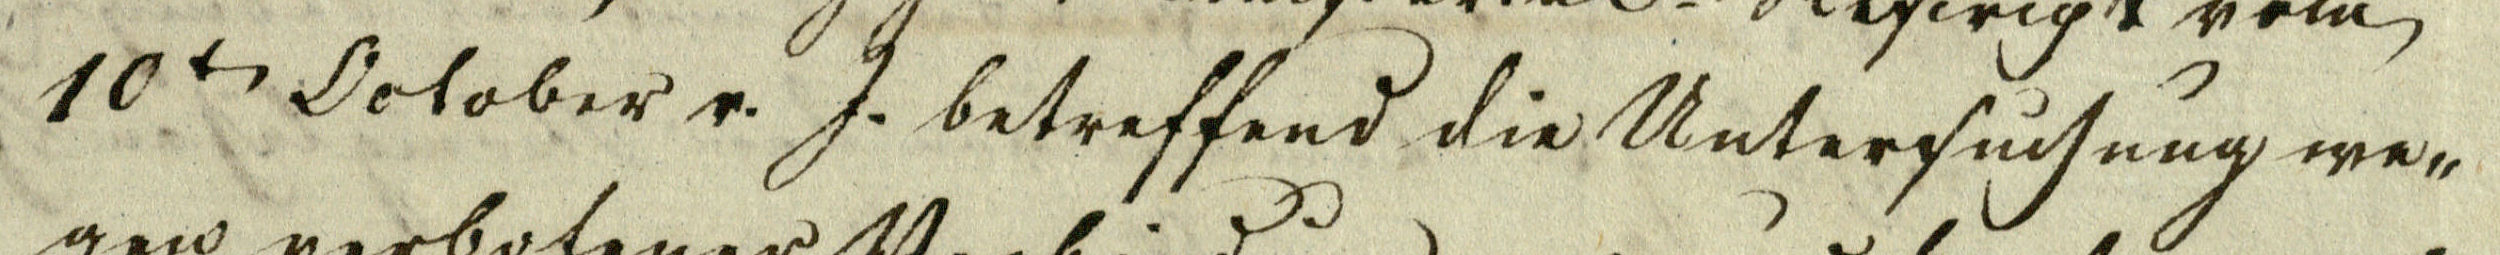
10ten October v. J. betreffend die Untersuchung we¬
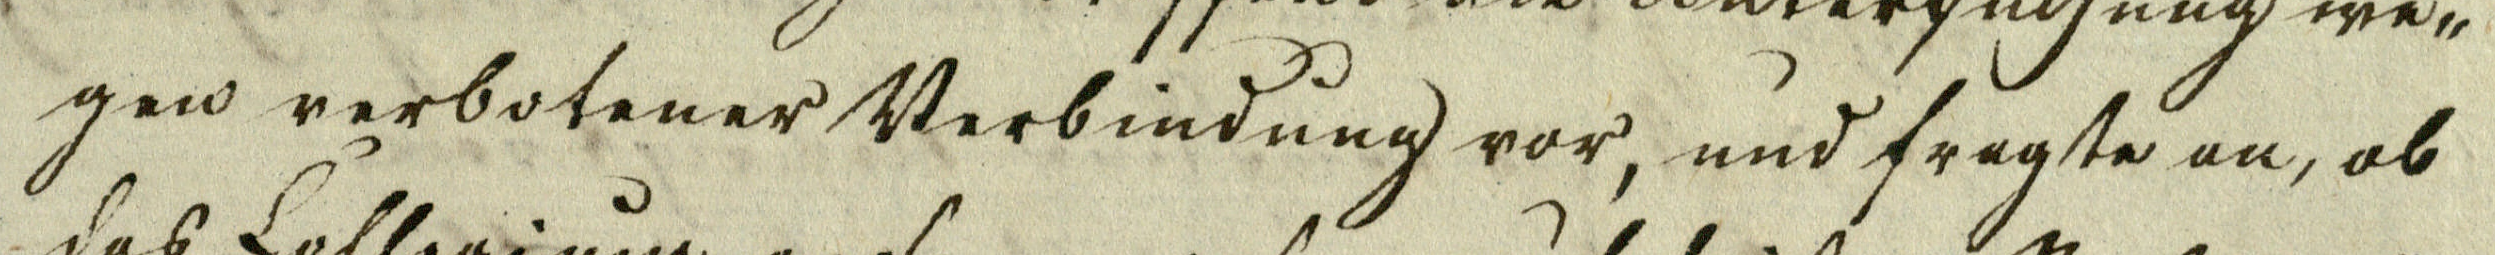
gen verbotener Verbindung vor, und fragte an, ob
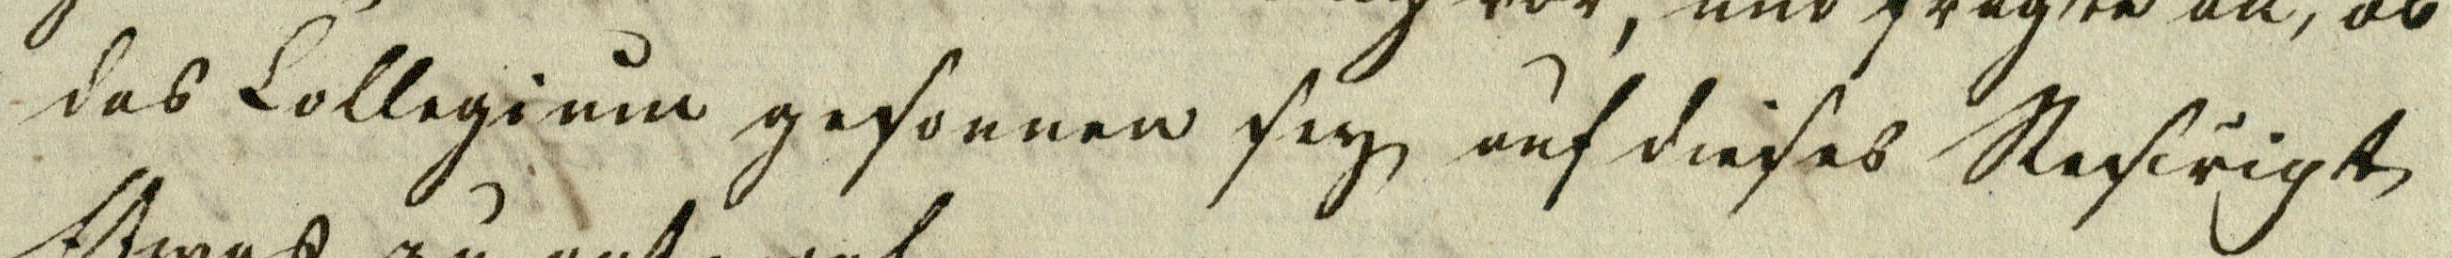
das Collgium gesonnen sey, auf dieses Rescript,
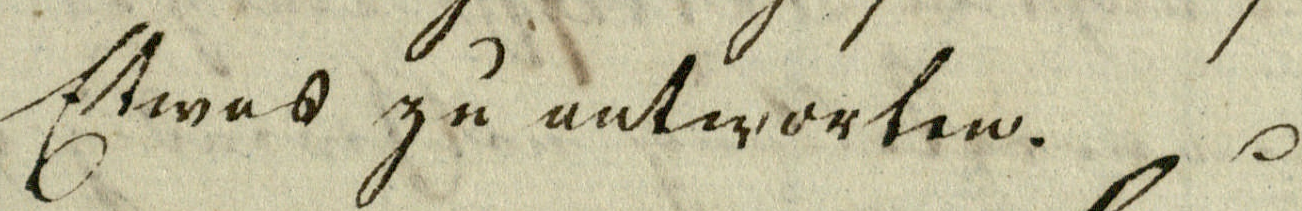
Etwas zu antworten.
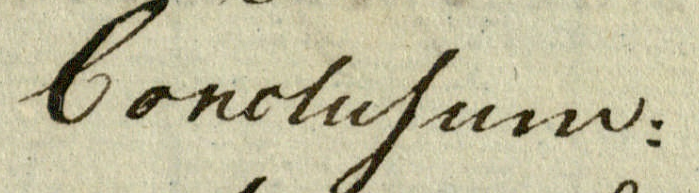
Conclusum:
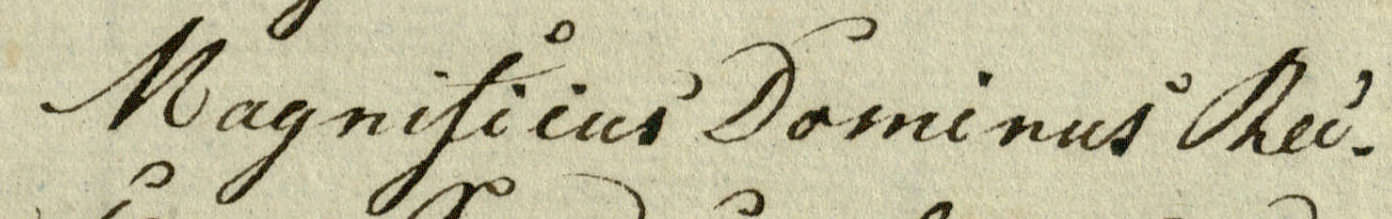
Magnificus Dominus Rec¬
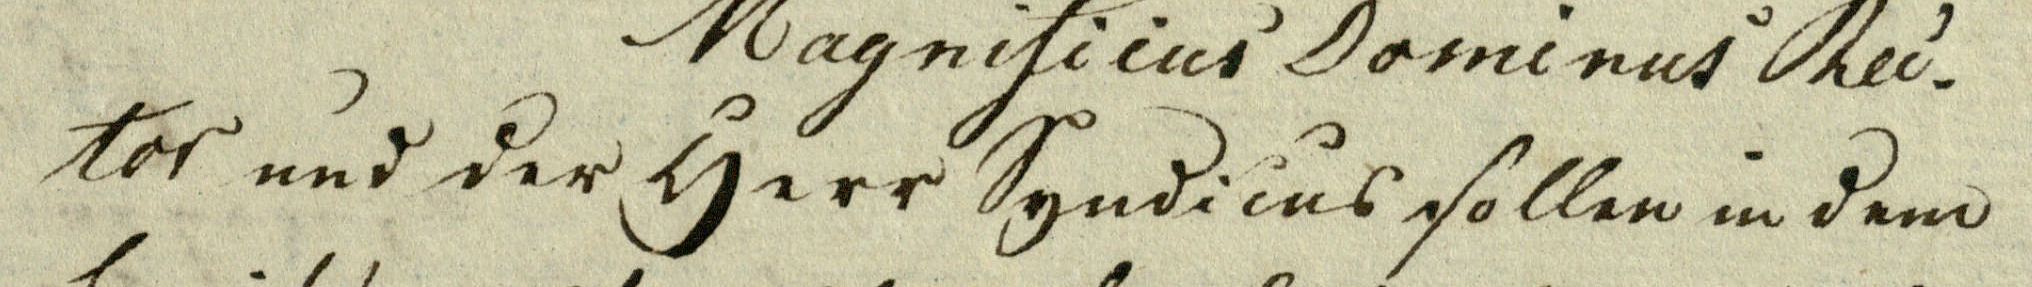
tor und der Herr Syndicus sollen in dem
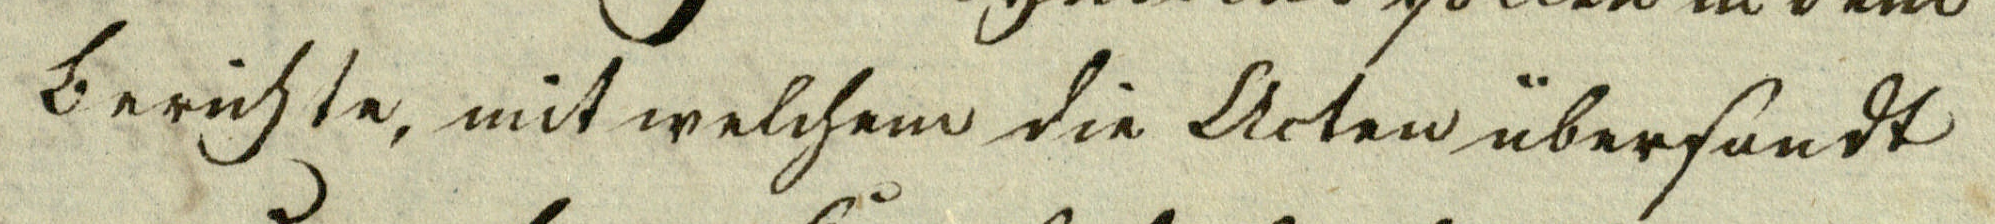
Berichte, mit welchem die Acten übersandt
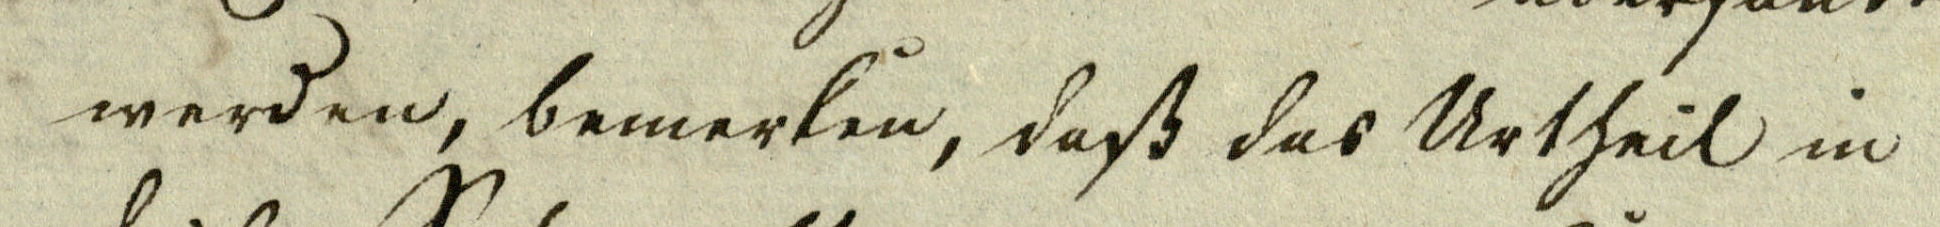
werden, bemerken, daß das Urtheil in
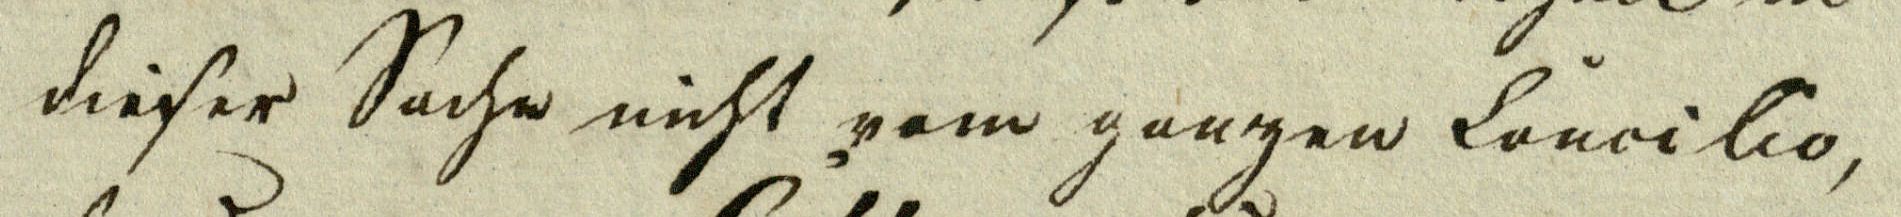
dieser Sache nicht vom ganzen Concilio,
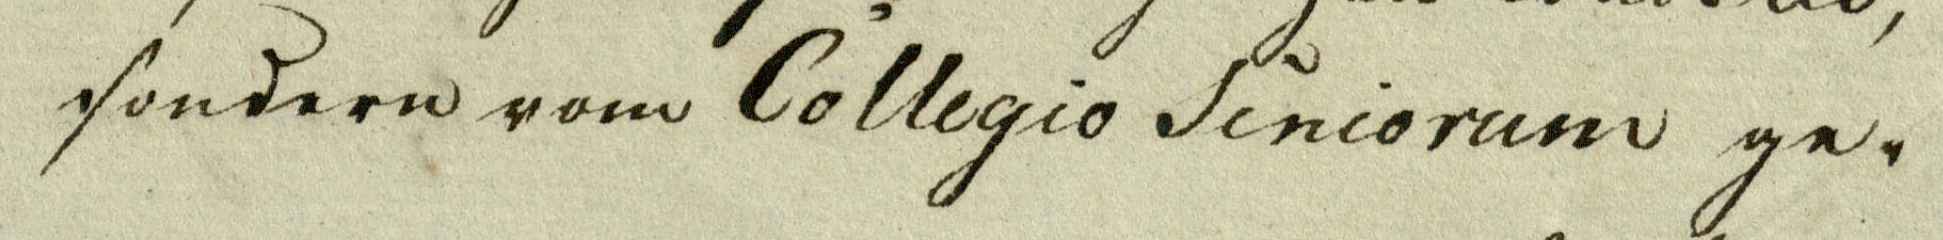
sondern vom Collegio Seniorum ge¬
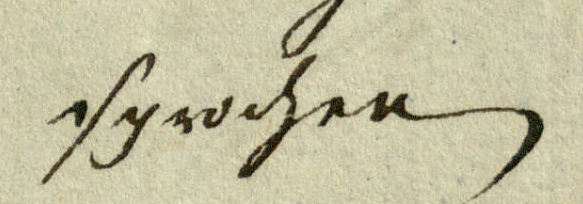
sprochen
